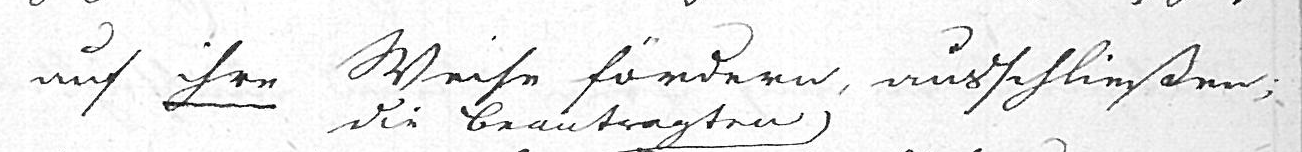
auf ihre Weise fördern, ausschließen,
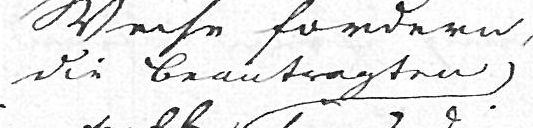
die beantragten
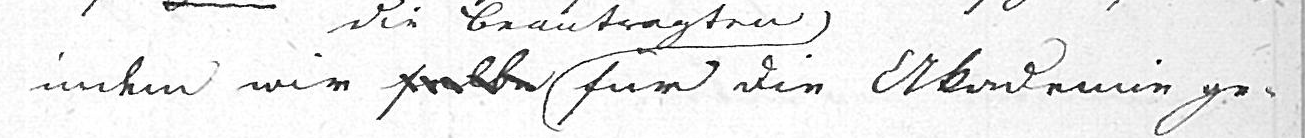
indem wir für die Akademie ge-
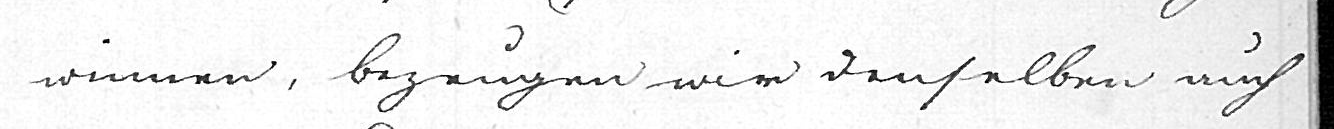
winnen, bezeugen wir denselben auch
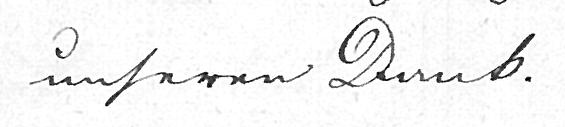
unseren Dank.
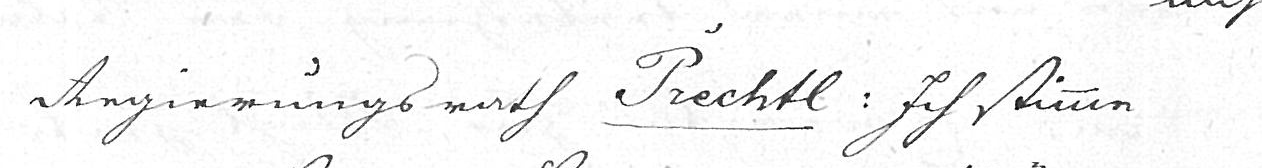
Regierungsrath Prechtl: Ich stimme
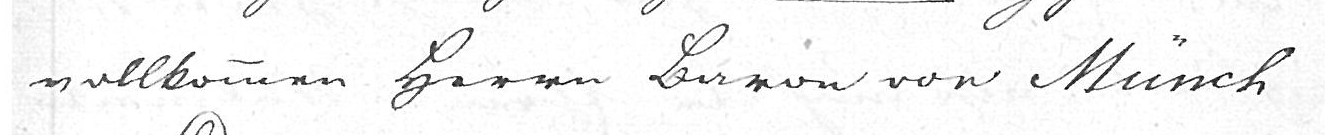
vollkommen Herrn Baron von Münch
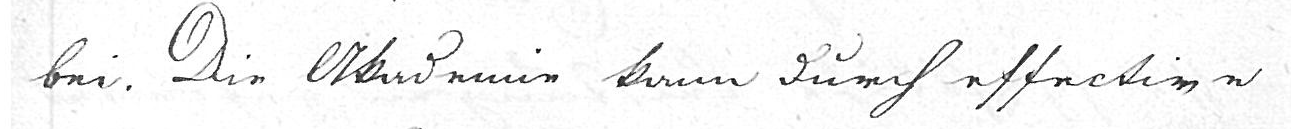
bei. Die Akademie kann durch effective
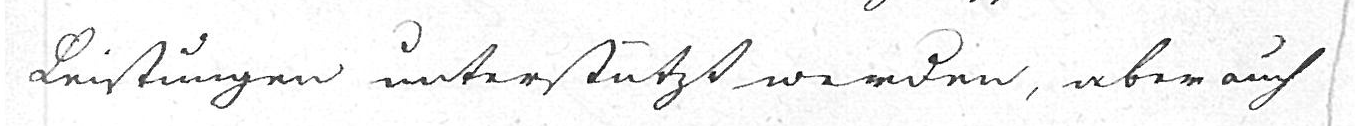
Leistungen unterstützt werden, aber auch
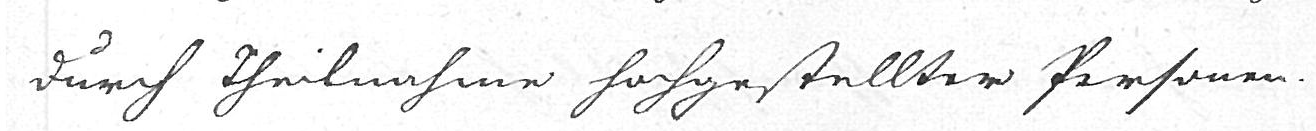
durch Theilnahme hochgestellter Personen.
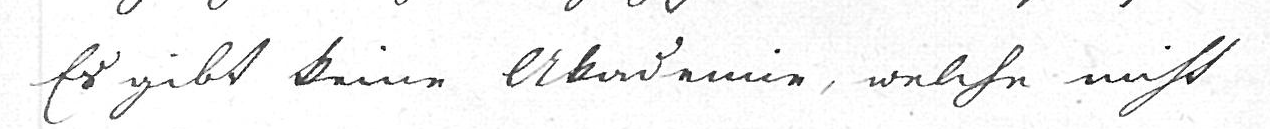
Es gibt keine Akademie, welche nicht
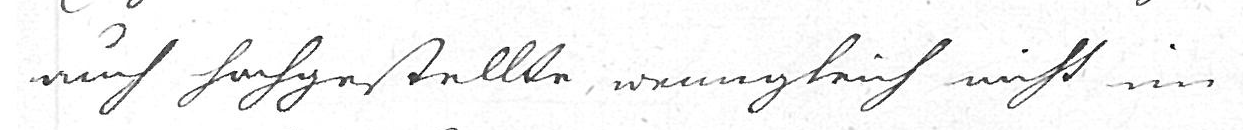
auch hochgestellte, wenngleich nicht im
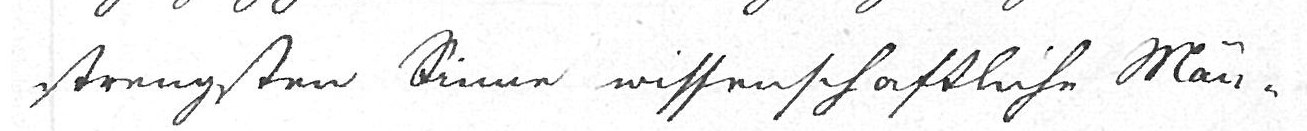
strengsten Sinne wissenschaftliche Män-
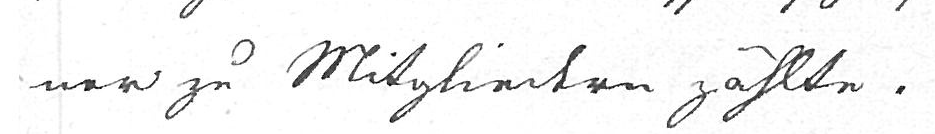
ner zu Mitgliedern zählten.
